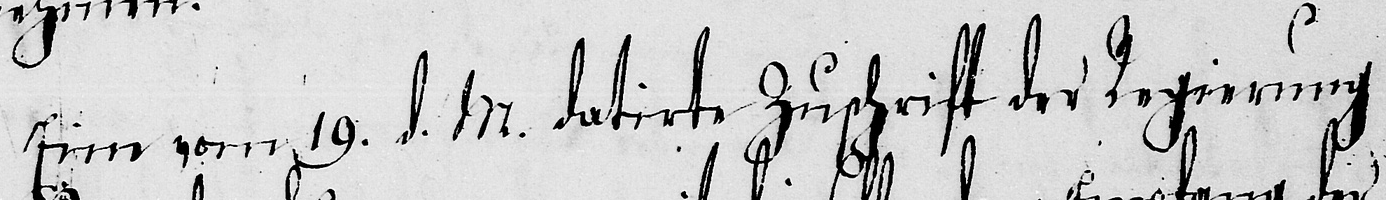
Eine vom 19. d. M. datirte Zuschrift der Regierung
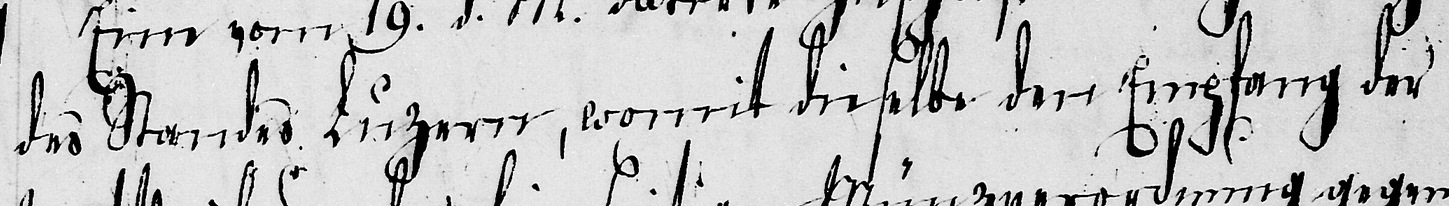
des Standes Luzern, womit dieselbe den Empfang der
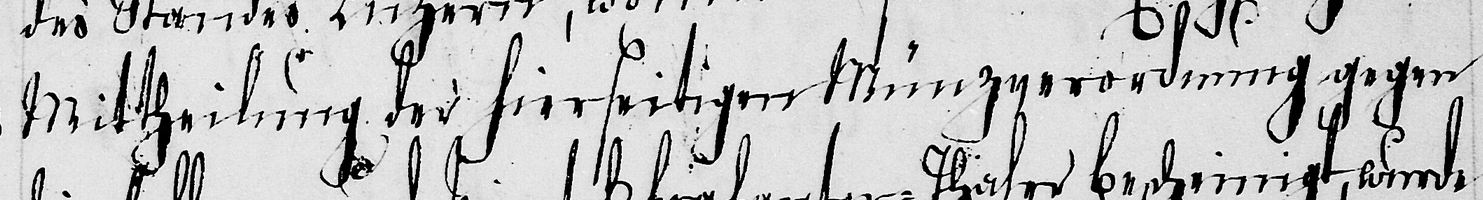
Mittheilung der hierseitigen Münzverordnung gegen
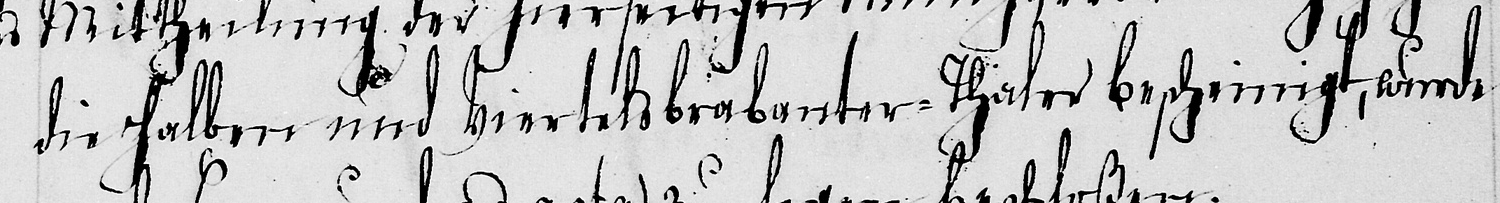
die halben und Viertelbrabanter-Thaler bescheinigt, wur¬
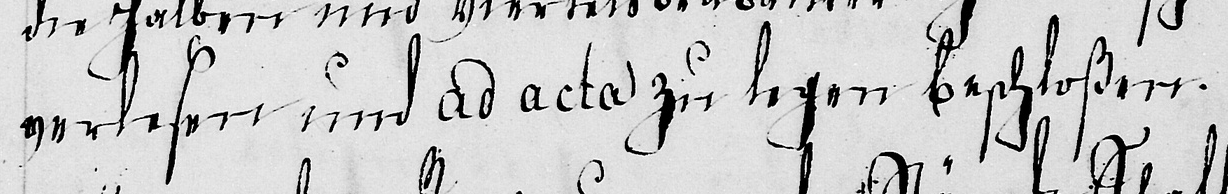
verlesen und ad acta zu legen beschloßen.
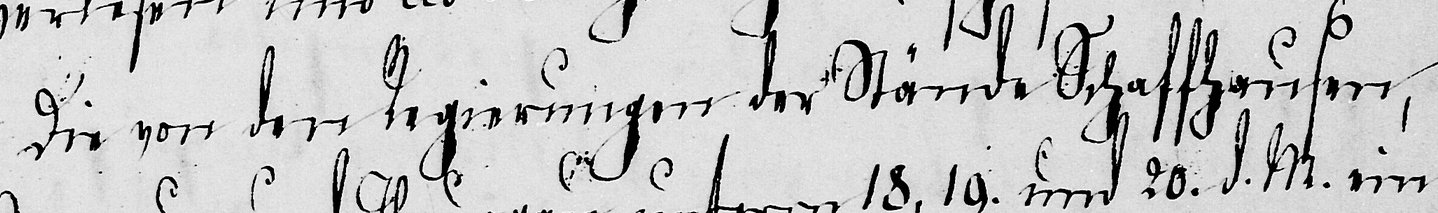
Die von den Regierungen der Stände Schaffhausen,
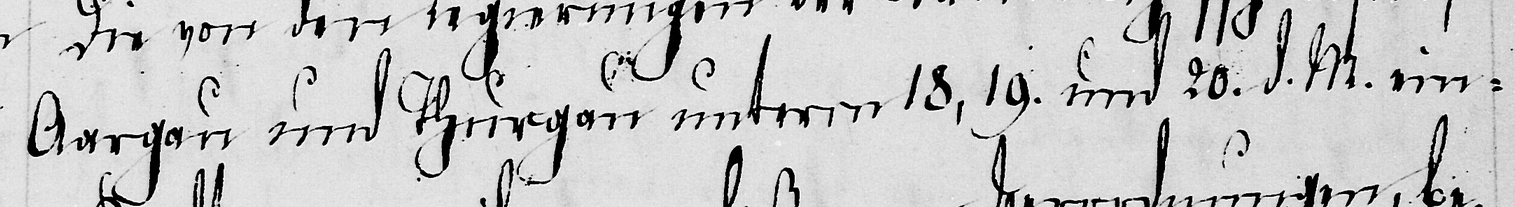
Aargau und Thurgau unterm 18, 19. und 20. d. M. ein¬
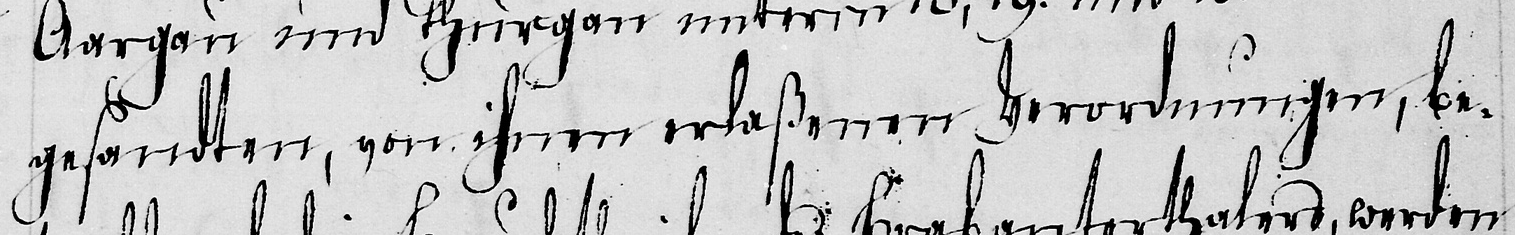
gesandten, von ihnen erlaßenen Verordnungen, be¬
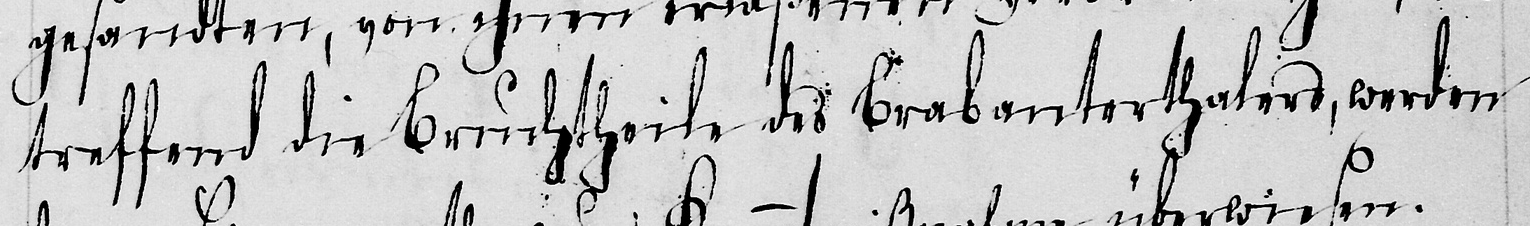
treffend die Bruchtheile des Brabanterthalers, werden
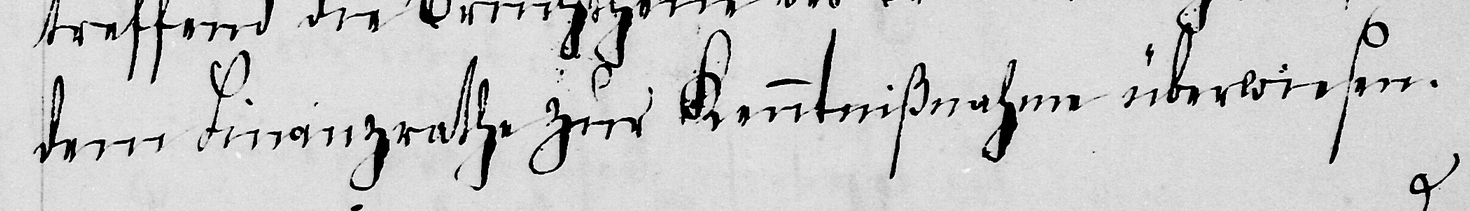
dem Finanzrathe zur Kenntnißnahme überwiesen.
